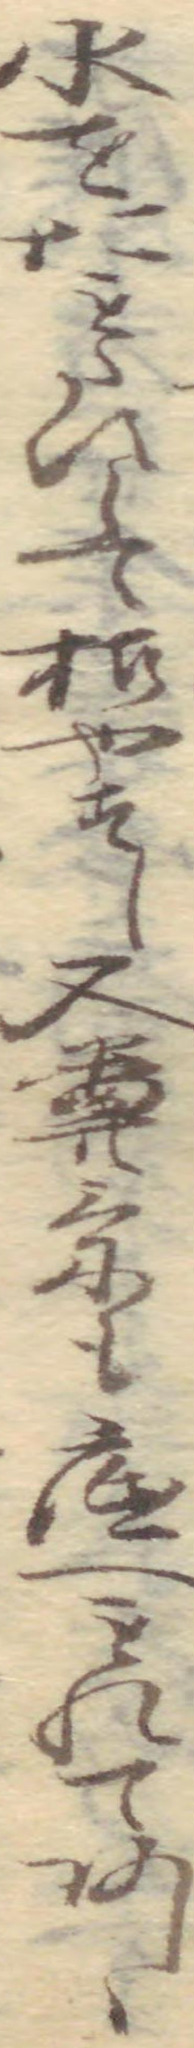水をたもたすして枯れやすし又糞気も底へもれてあし也
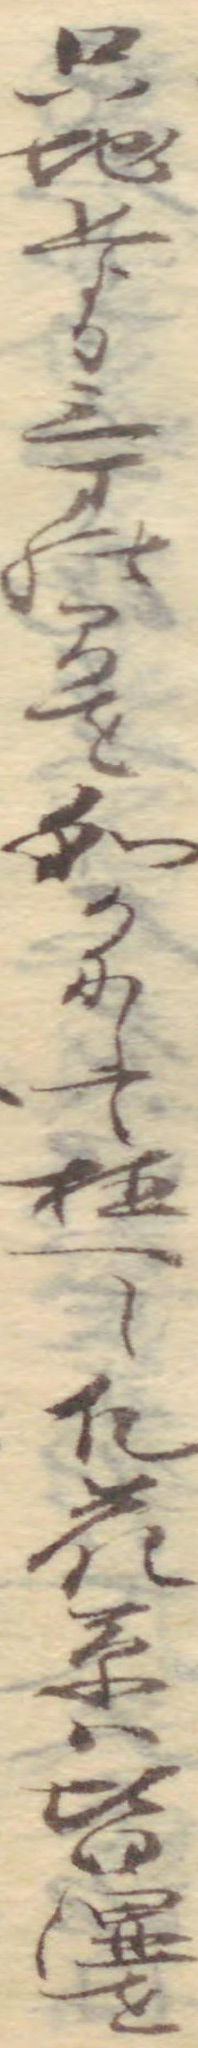只地上より三寸の間を和かにして植へし凡花草ハ皆湿を
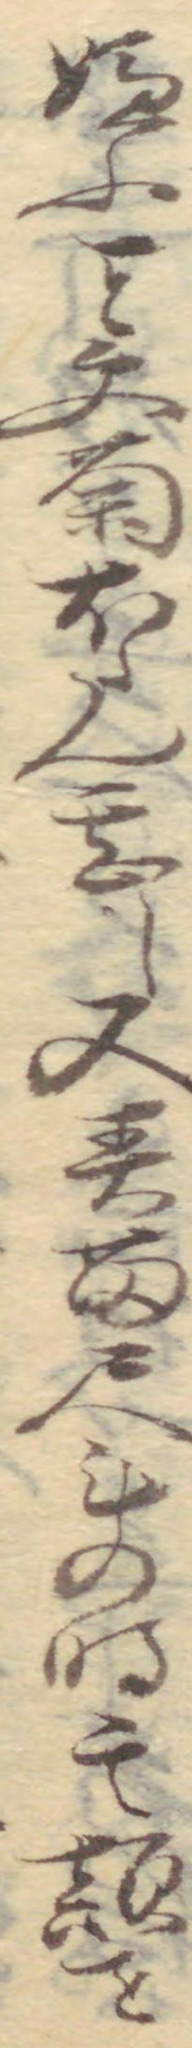嫌ふこと更菊ほたん甚し又春苗尺斗の時其顛を
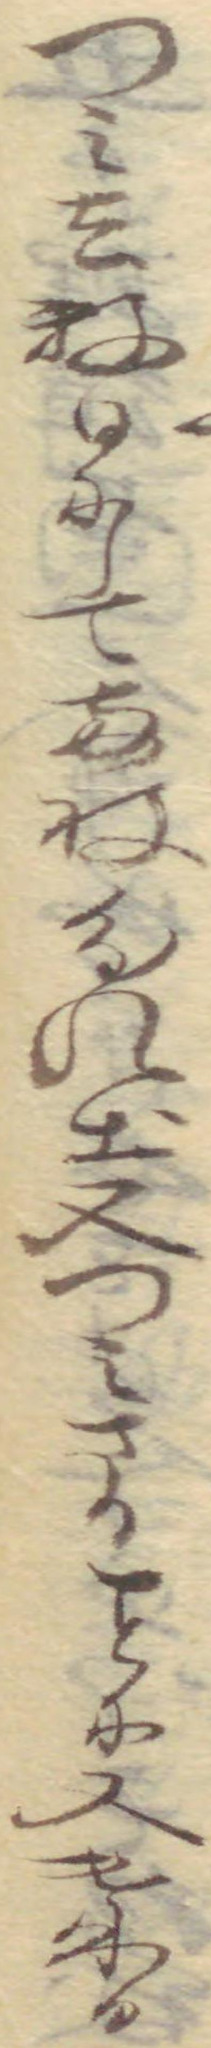つミ去数日にして両枝分れ土又つミさることに又出来る
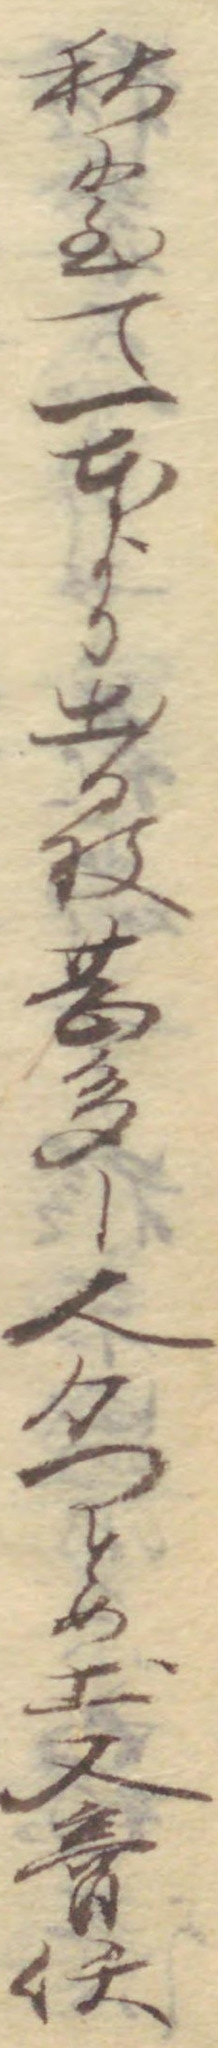秋に至て一本より出る枝甚多し人力つとめ土又膏沃
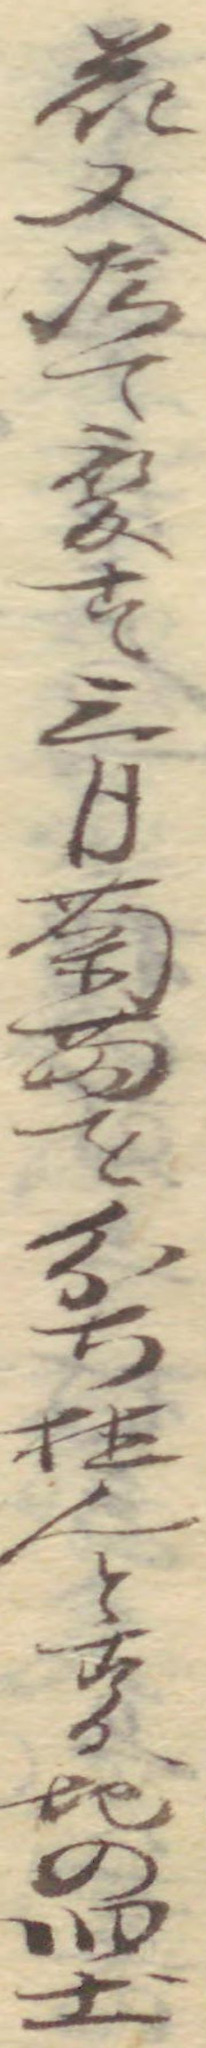花又落て変す三月菊苗を分ち植んとする地の旧土
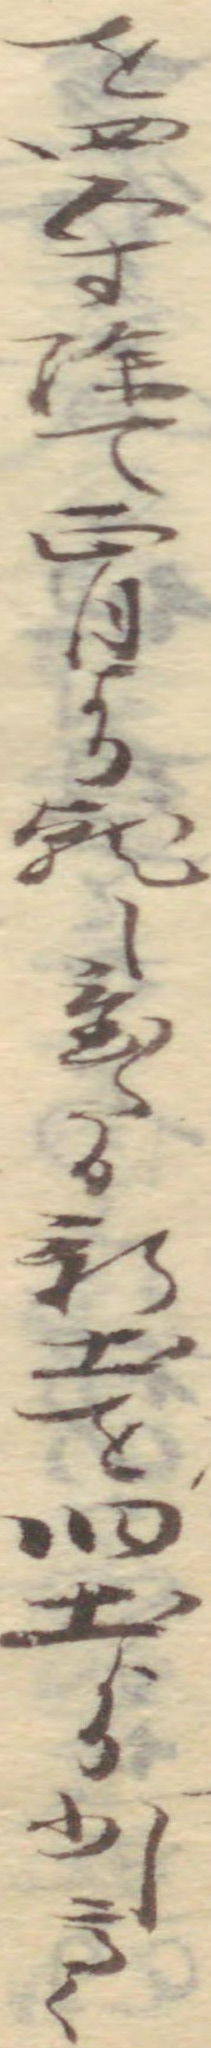を四五寸除て正月より乾し置たる新土を旧土より少し高く
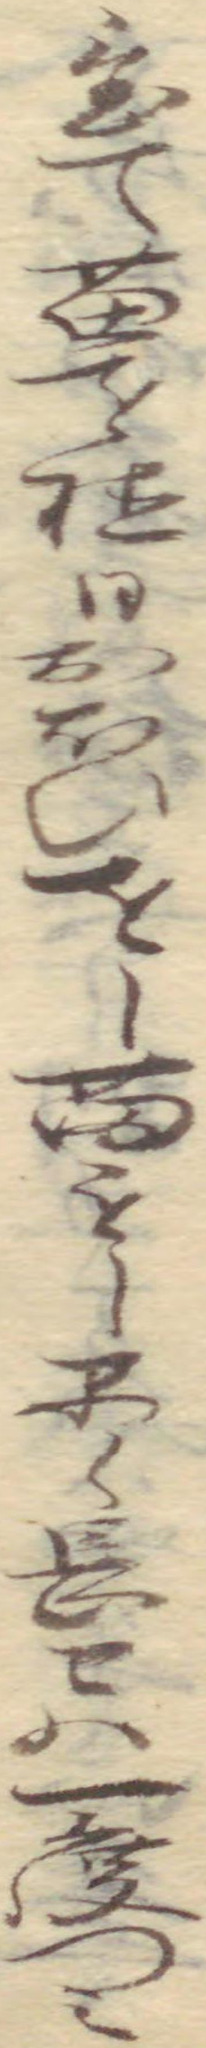置て苗を植日おほひをし苗もし早く長せハ一度つミ
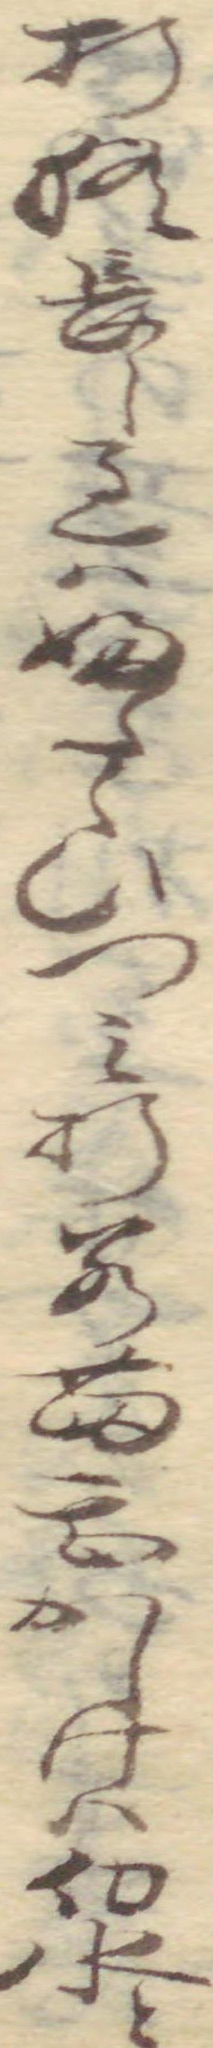折猶長し過ハふたゝひつミ折若苗甚かしけハ白水と
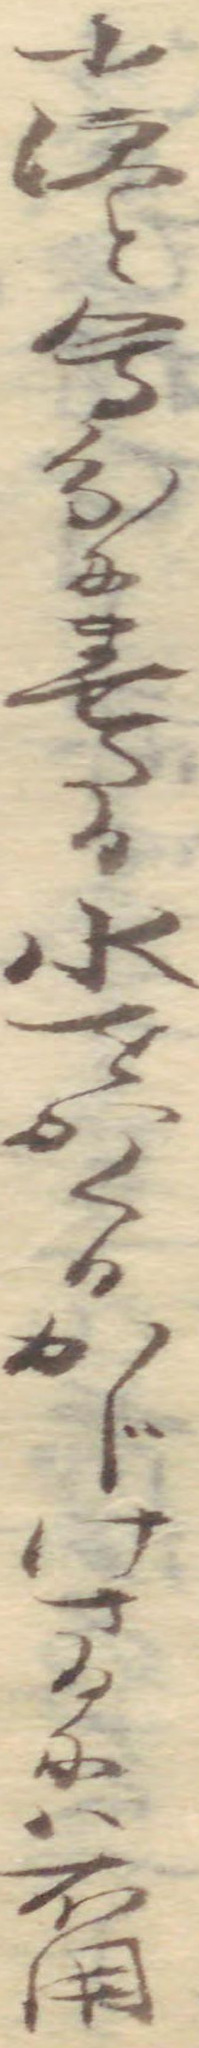小便と等分にませたる水をかくるかじけさるにハ不用
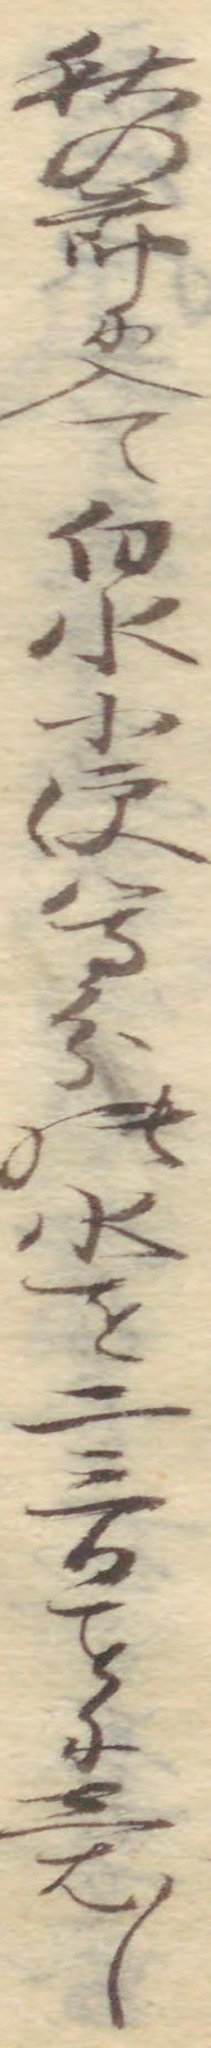秋の節に入て白水小便等分の水を二三日ことにしは〳〵
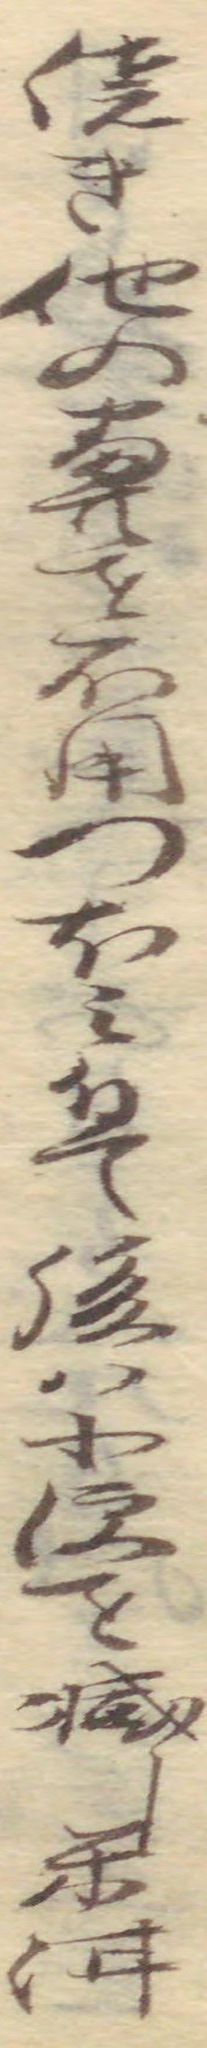澆き他の糞を不用つほミ付て後ハ小便を減し米泔
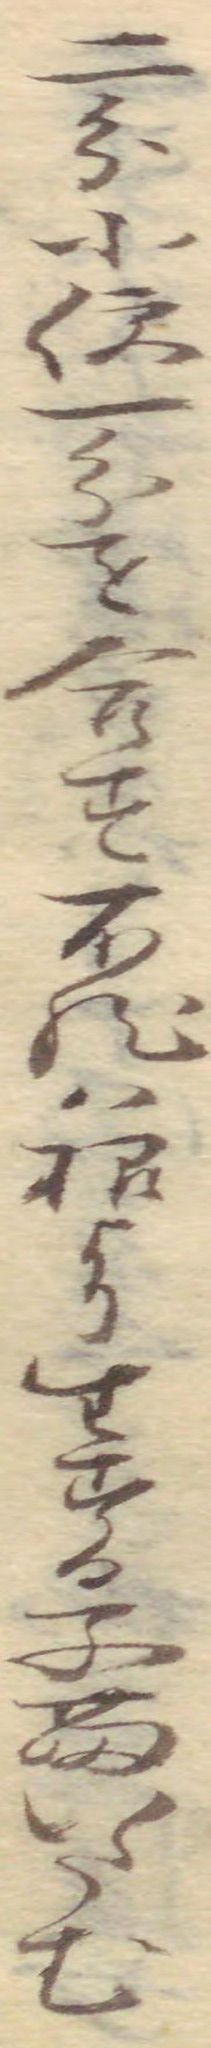二分小便一分を合す不然ハ根より生する子苗いたむ
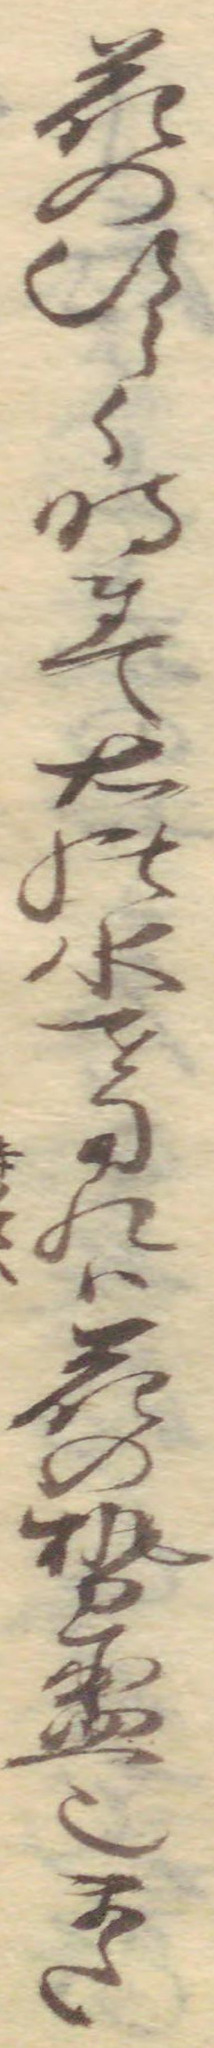花のひらく時まて右の水を用れハ花の勢盛也また
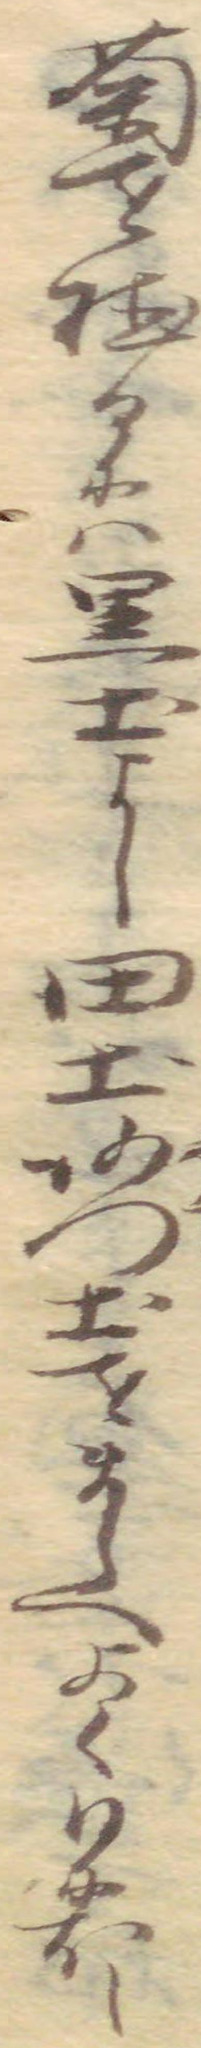菊を植るにハ黒土よし田土河つ土をましへよく日にほし

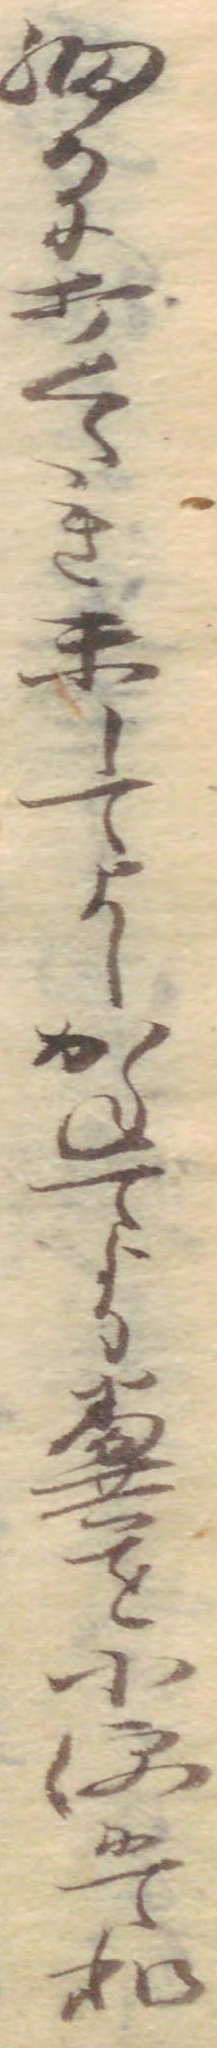細かに打くたき末してよしかねてより糞を小便にて和
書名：鶯宿雑記. 巻199-200
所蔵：国立国会図書館 National Diet Library, JAPAN
